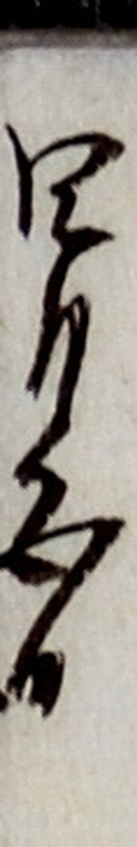四月五日
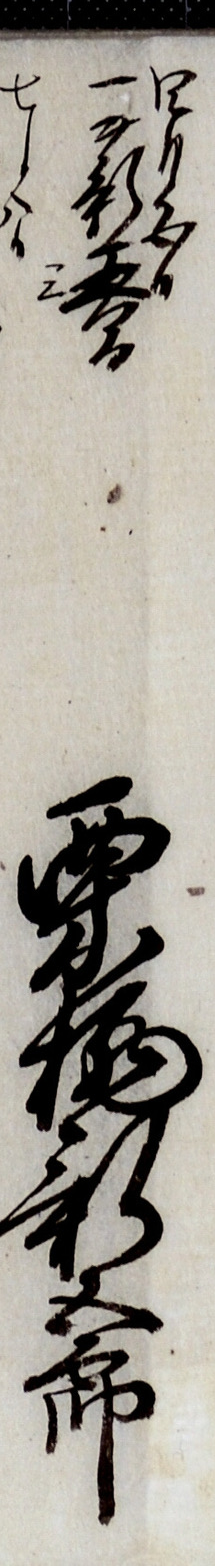一薪五間栗柄新五郎
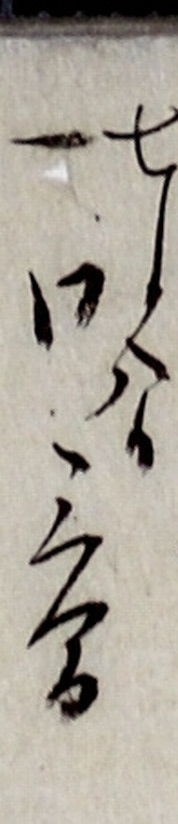一同三間
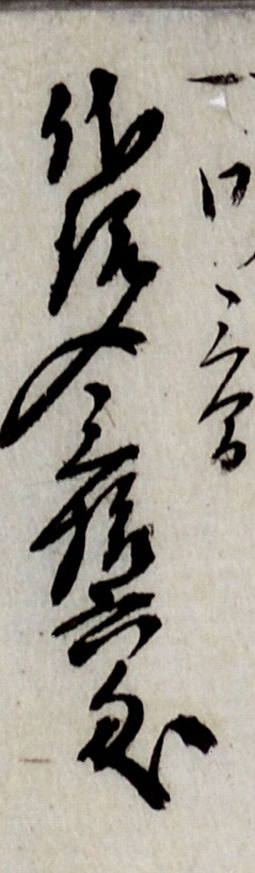代銀〆三拾六匁
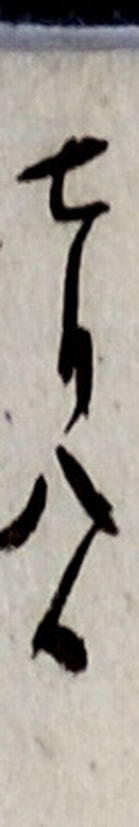七月八日
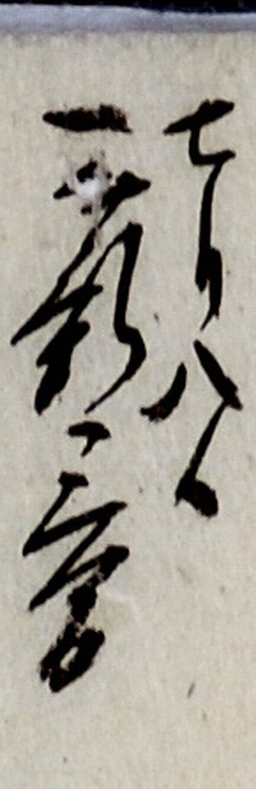一同三間
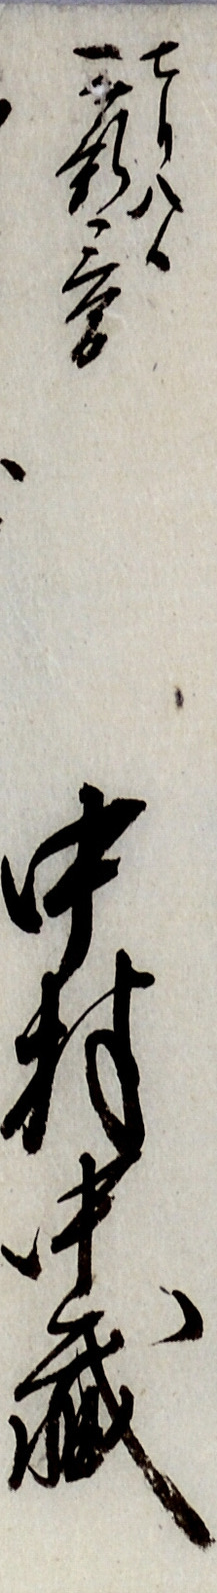一薪三間中村中蔵
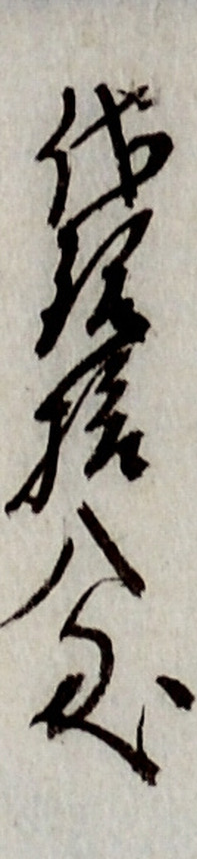代銀拾八匁
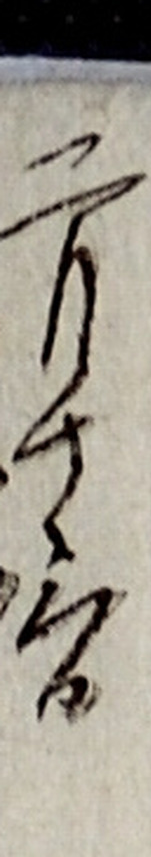二月十三日
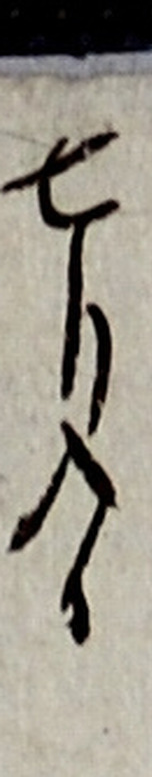七月八日
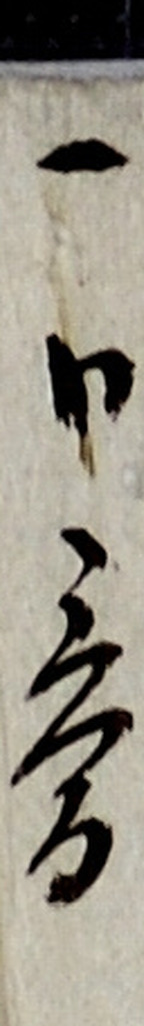一同三間
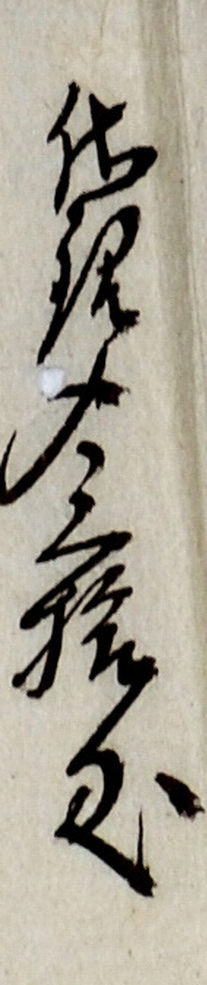代銀〆三拾匁
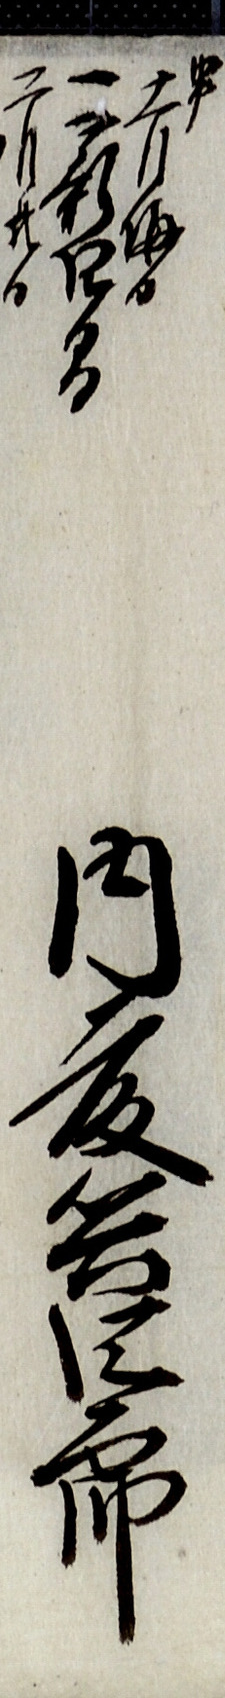一薪四間内藤兵四郎
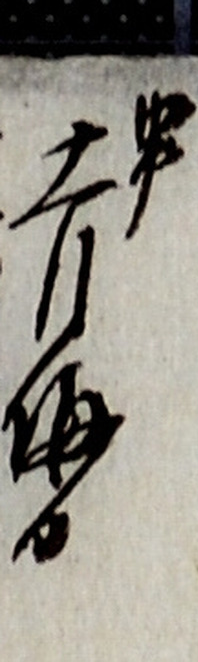十一月晦日
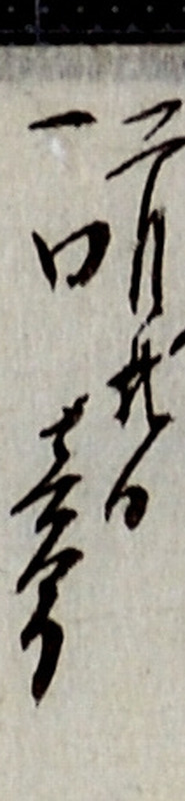一同壱間
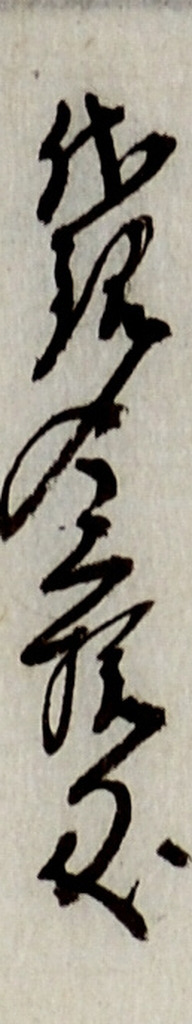代銀〆三拾匁
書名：覚
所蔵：伊那市立高遠町図書館・合同会社AMANE
